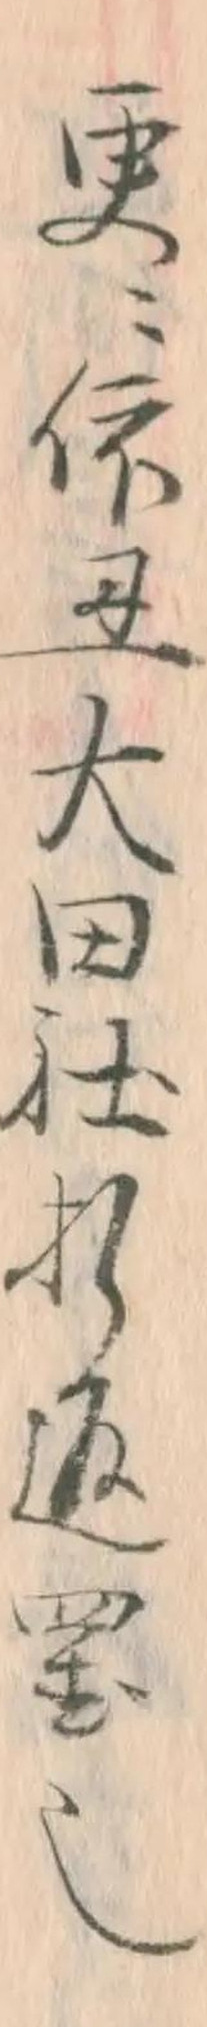更ニ依丑大田社折返置也
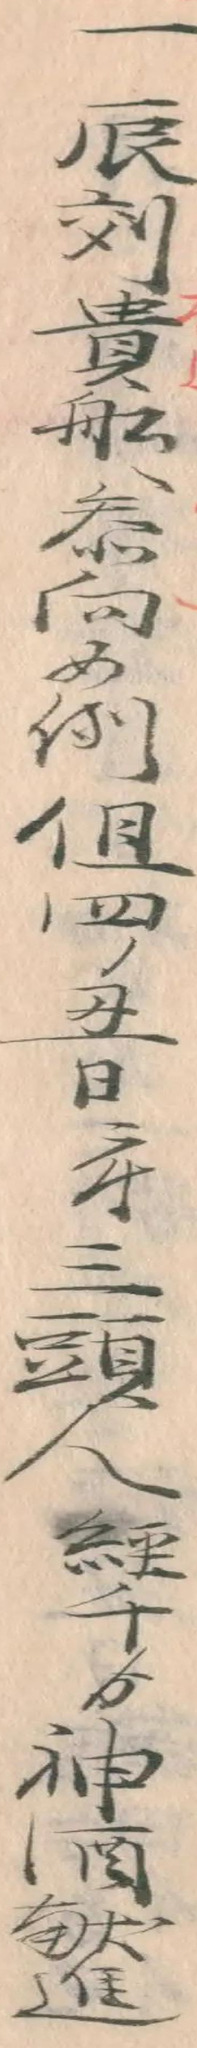一辰刻貴舩へ参向如例但四ノ丑日ニ付三頭人経千ゟ神酒献進
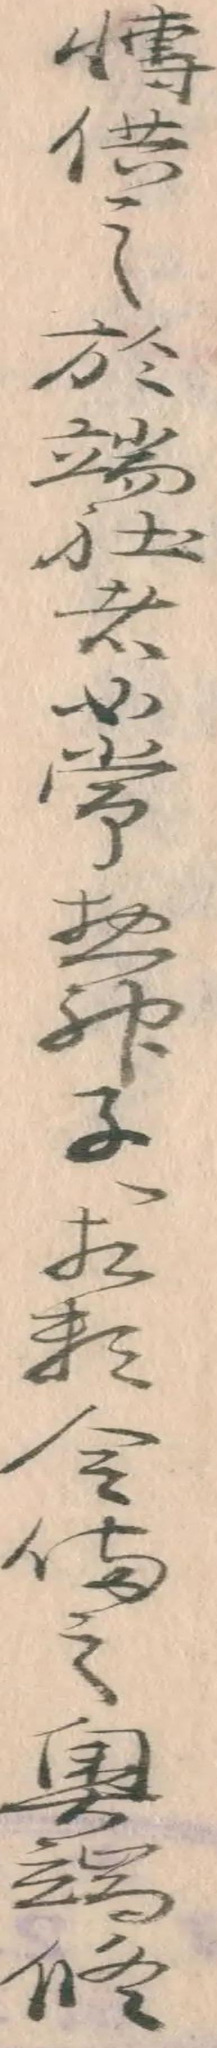轉供之於端社者如常惣神子へ相頼令備之奥端修
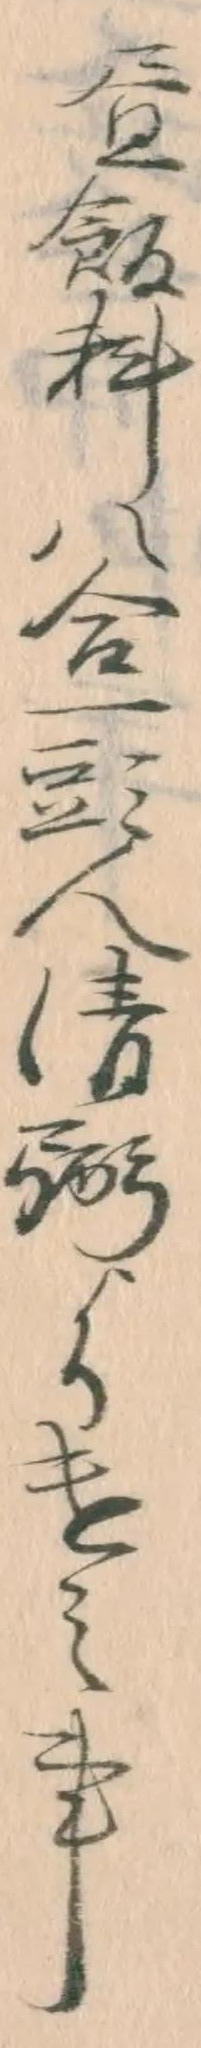昼飯料八合一頭人清弼より遣之事
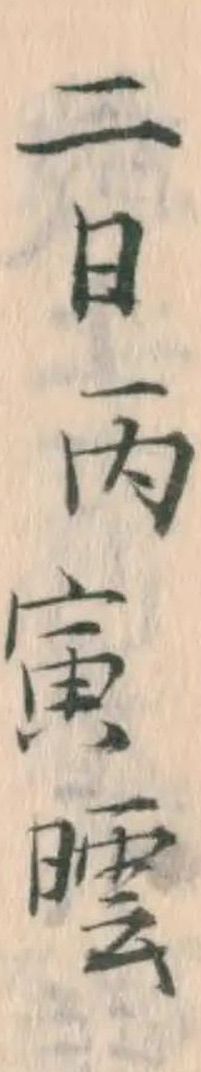二日丙寅曇
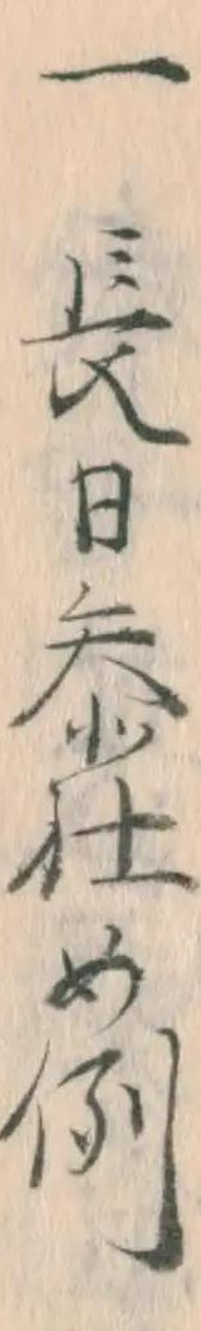一長日参社如例
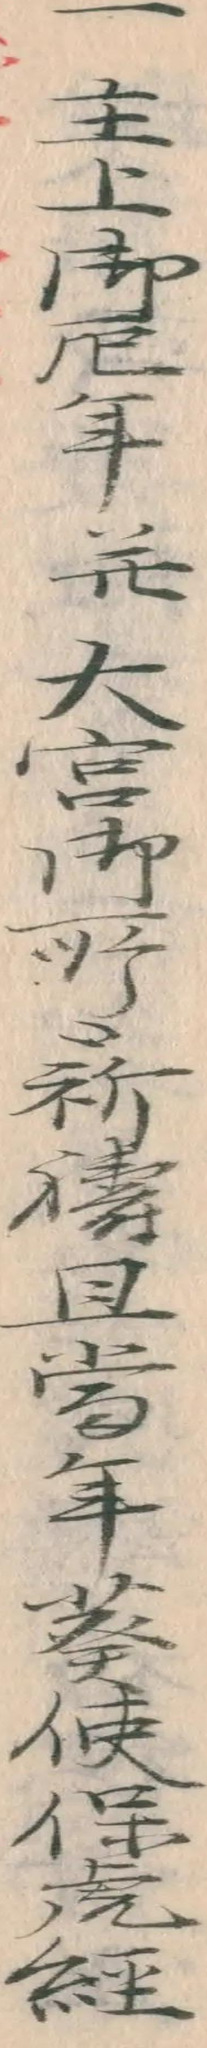一主上御厄年并大宮御所御祈祷且當年葵使保虎経
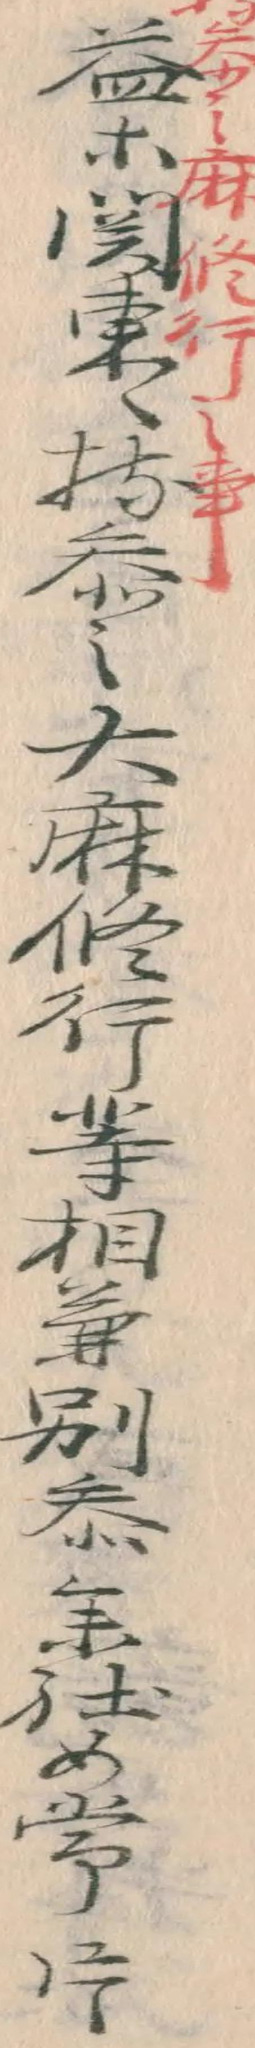益等関東へ持参之大麻修行等相兼別参参社如常片
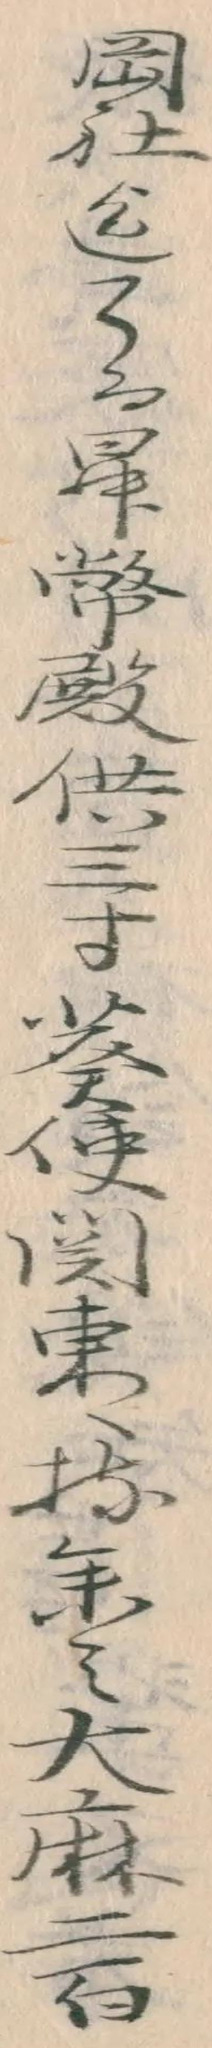岡社迄了而昇幣殿供三寸葵使関東へ持参之大麻二百
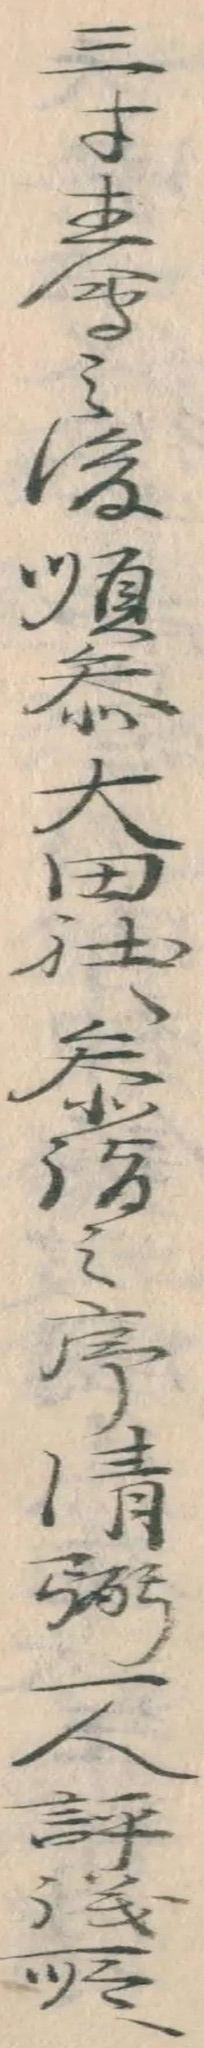三寸直會之後順参大田社へ参詣之序清弼一人評議所へ
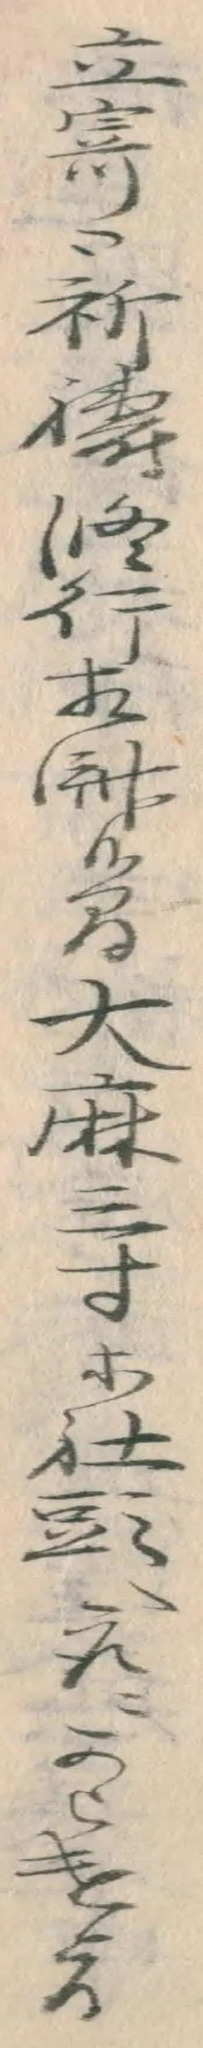立寄御祈祷修行相済候間大麻三寸等社頭へ取ニ可被遣旨
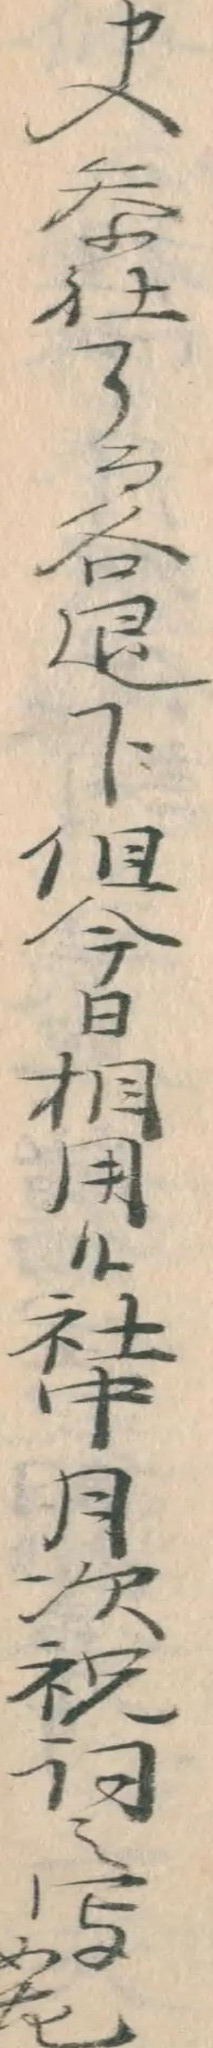申入参社了而各退下但今日相用候社中月次祝詞之写左

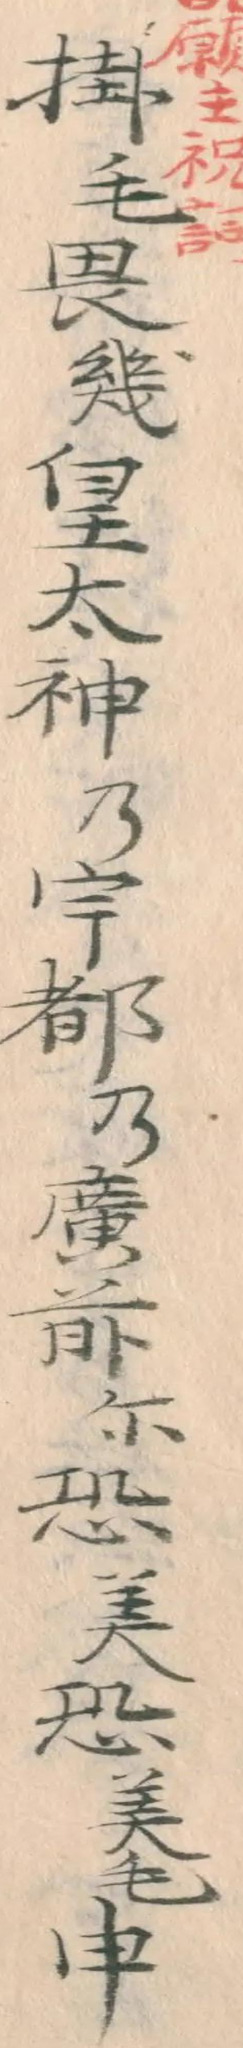掛毛畏幾皇太神乃宇都之廣前尓恐美恐美毛申
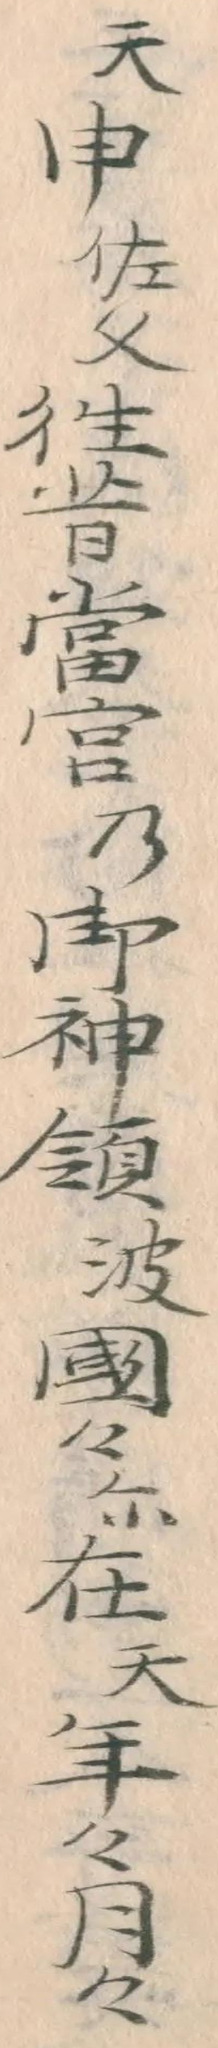天申佐久往昔當宮乃御神領波國々尓在天年々月々
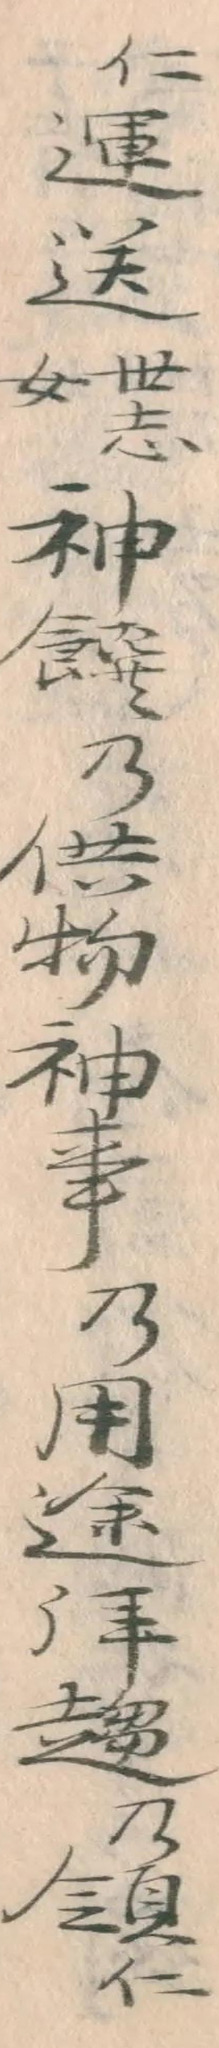仁運送世志女神饌之供物神事乃用途拝趨乃領仁
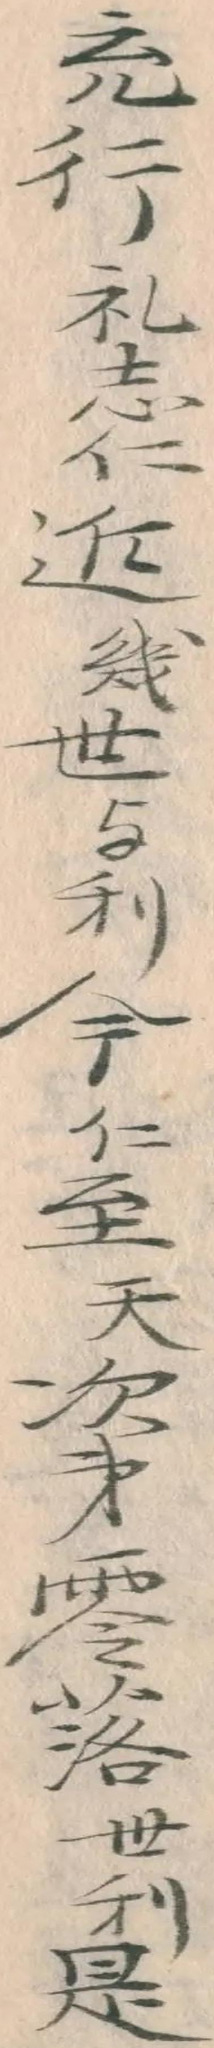充行礼志仁近幾世与利今仁至天次第零落世利是
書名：賀茂社記録. 第73冊
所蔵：国立国会図書館 National Diet Library, JAPAN
